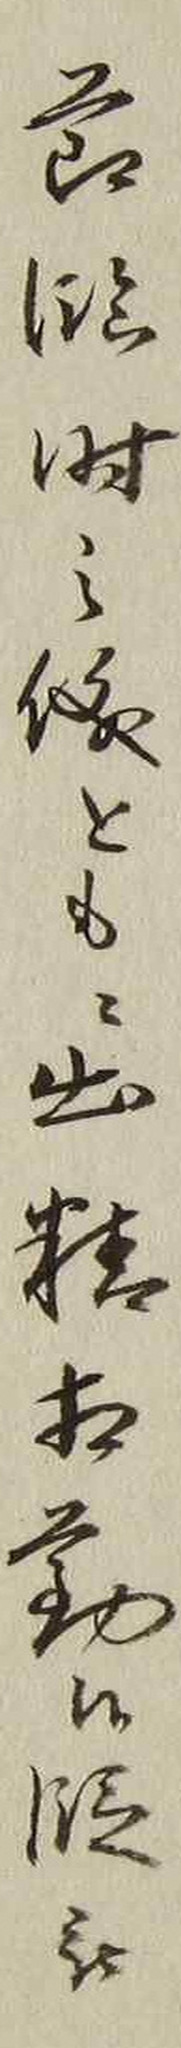節臨時之儀ともニ出精相勤候段被
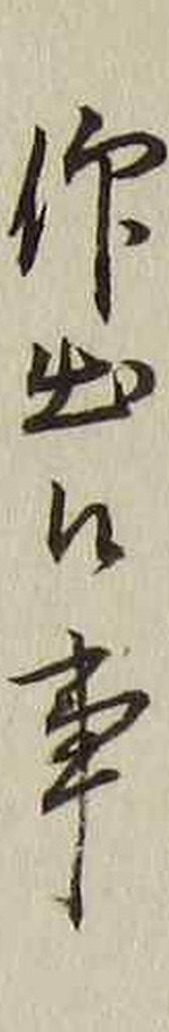仰出候事
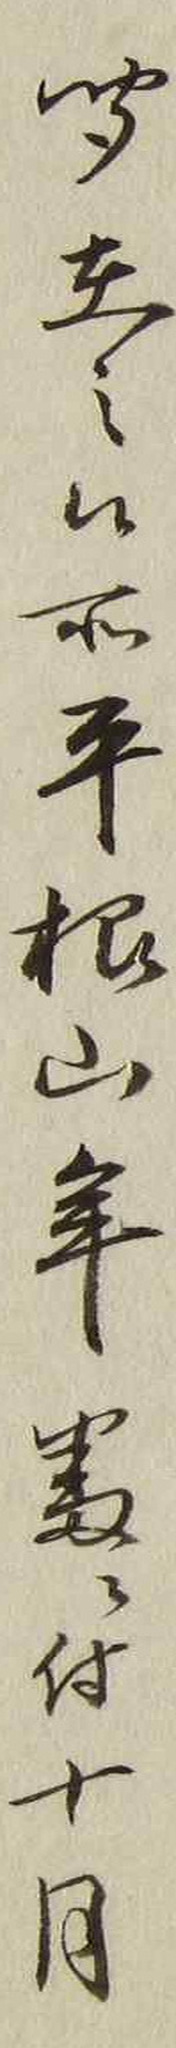聞在之候所平根山年番ニ付十月
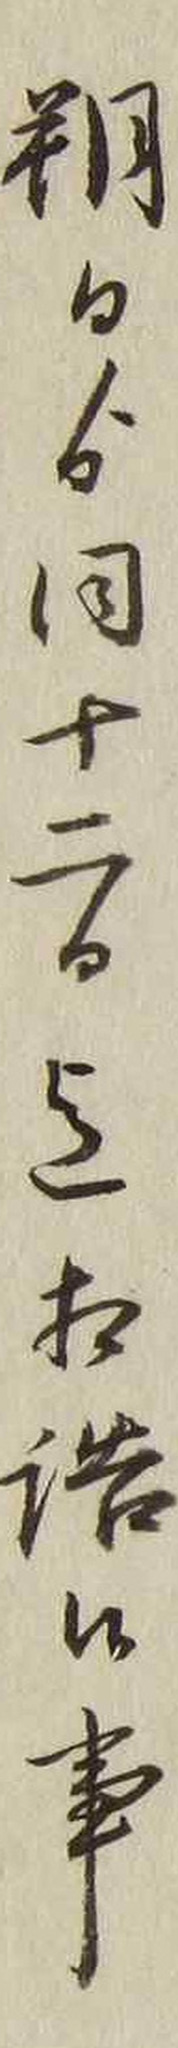朔日ゟ同十二日迄相詰候事

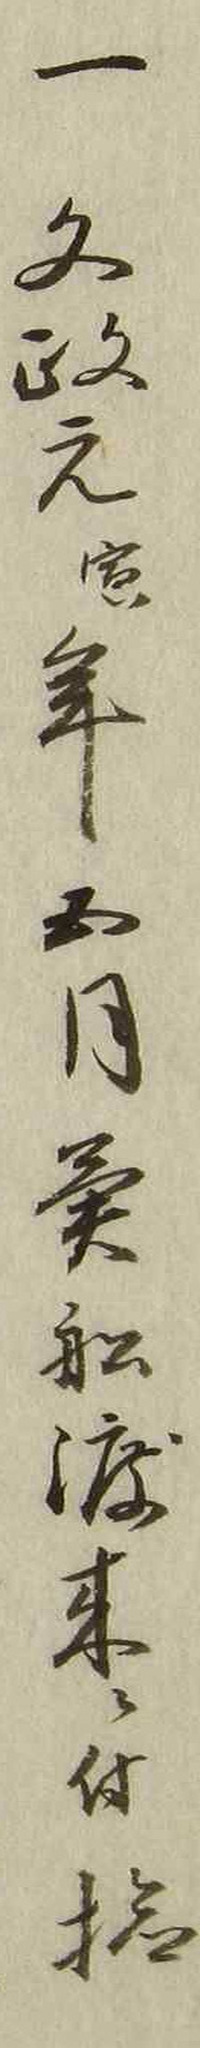一文政元寅年五月異船渡来ニ付検
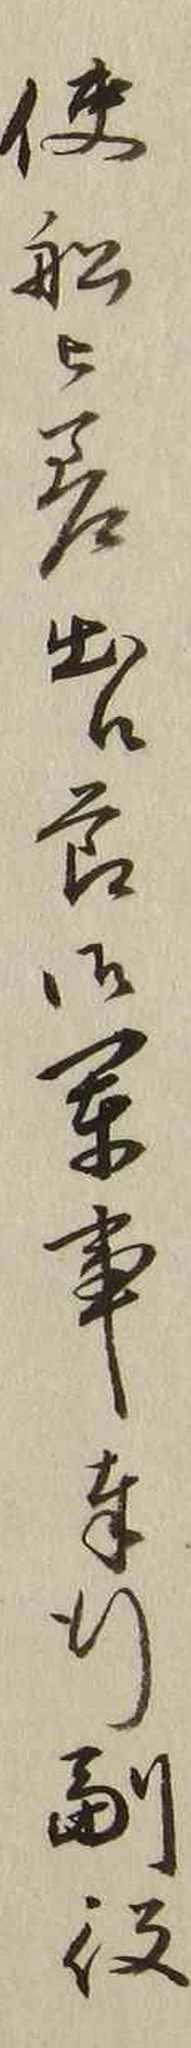使船被差出候節御軍事奉行副役
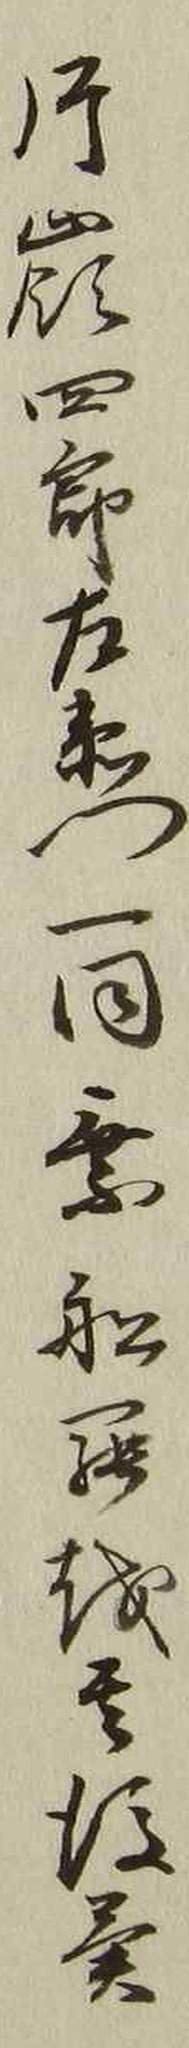片嶺四郎左衛門一同乗船罷越其後異
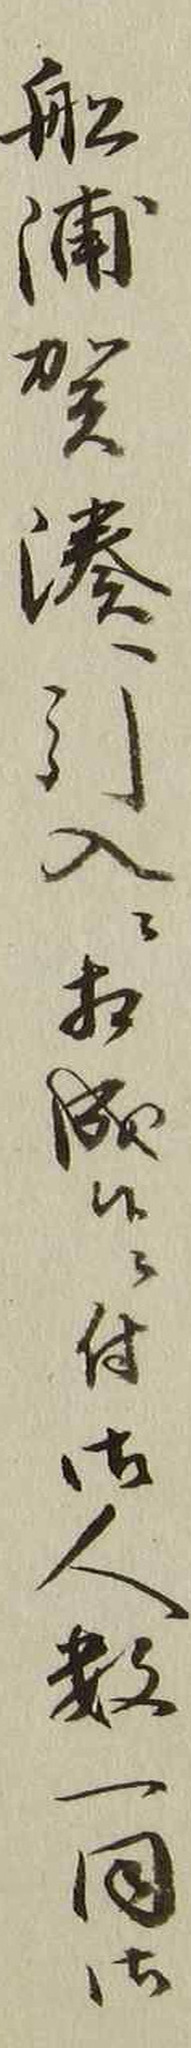船浦賀湊へ引入ニ相成候ニ付御人数一同御
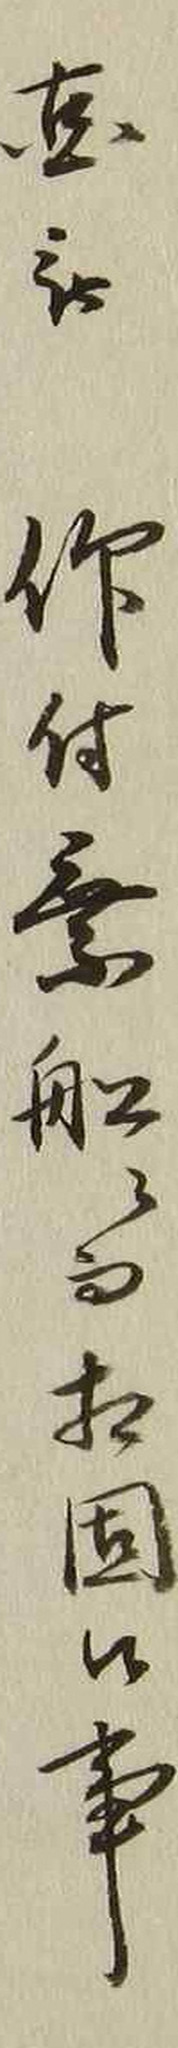固被仰付乗船ニ而相固候事
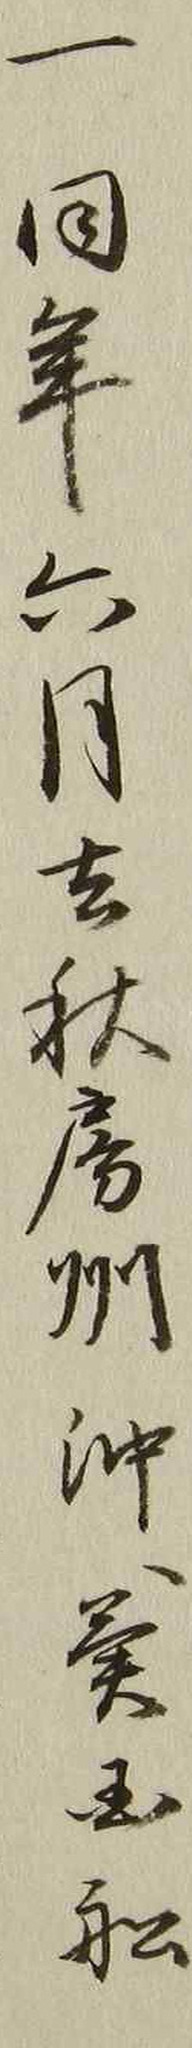一同年六月去秋房州沖へ異国船
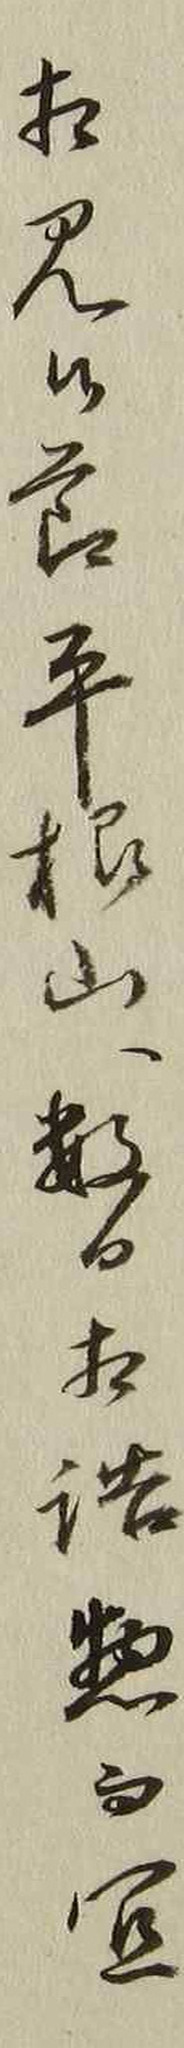相見候節平根山へ数日相詰惣而宜
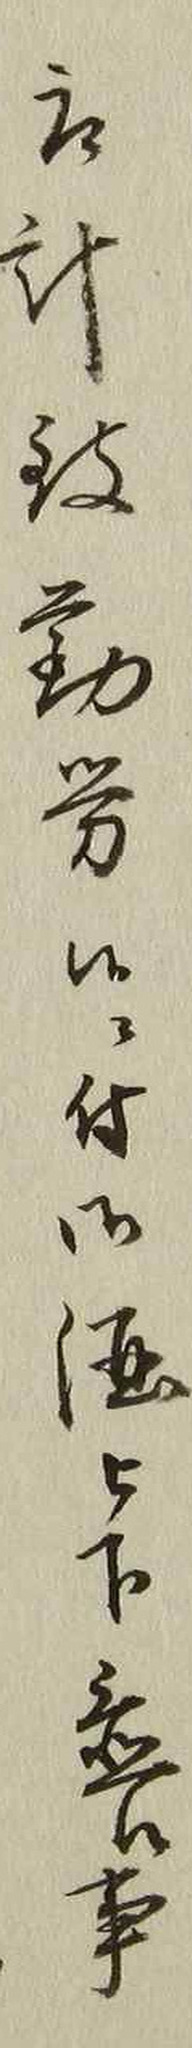取計致勤労候ニ付御酒被下置候事
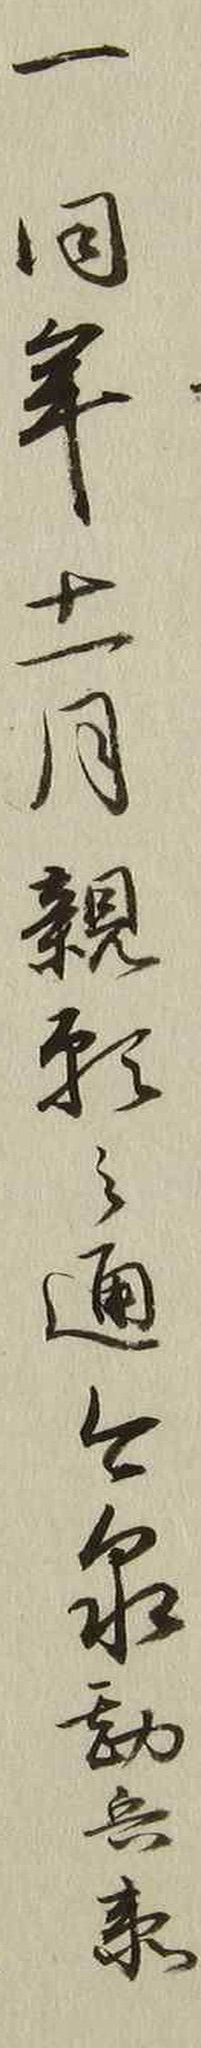一同年十一月親願之通今泉勘兵衛
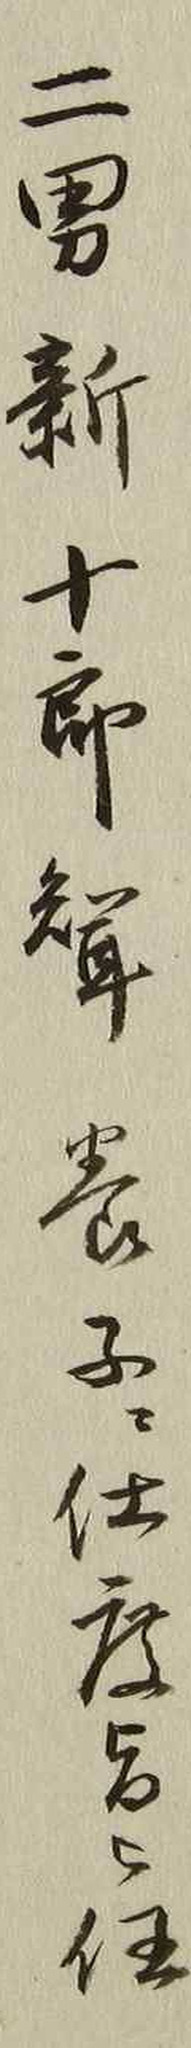二男新十郎婿養子ニ仕度旨被任
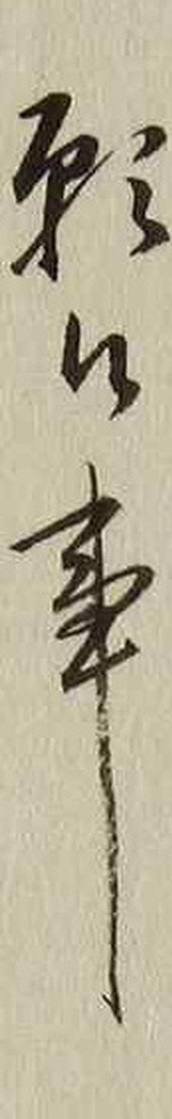願候事
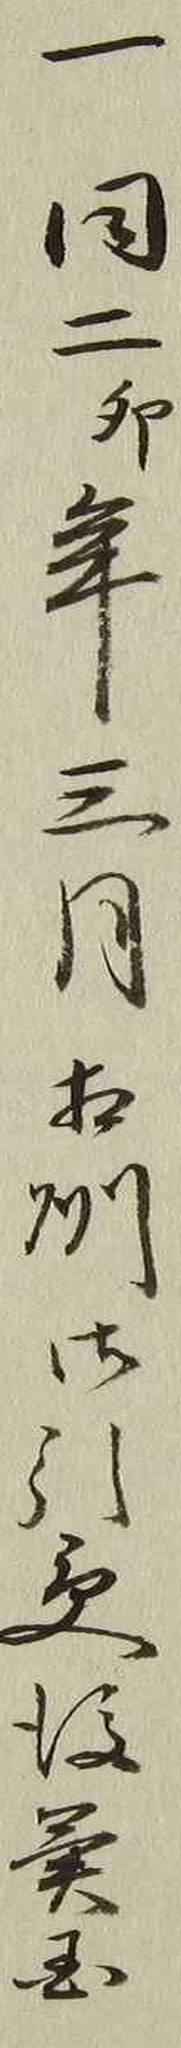一同二卯年三月相州御引受後異国
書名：諸士系譜　巻之128　た之部4
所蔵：会津若松市立会津図書館
